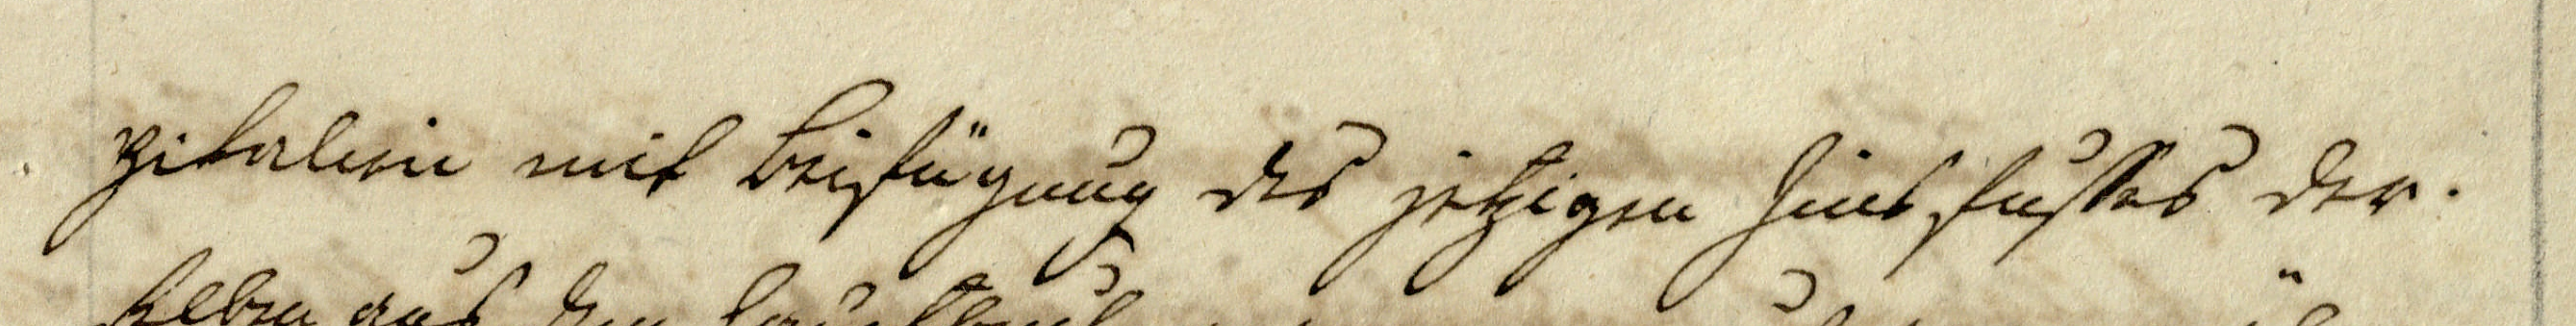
pitalien mit Beifügung des jetzigen Zinsfusses der¬
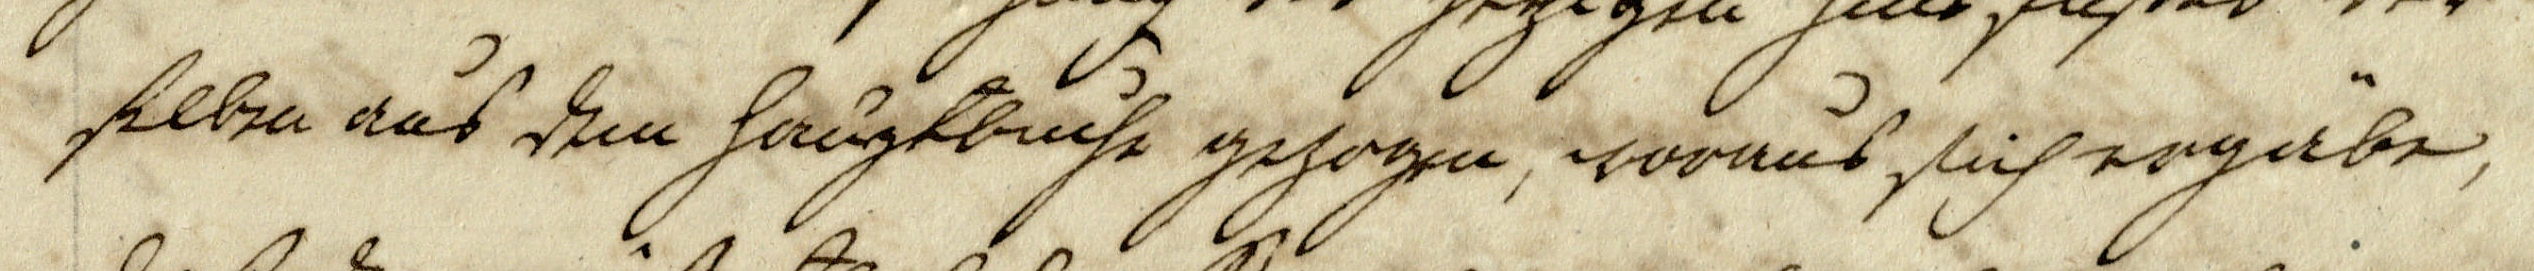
selben aus dem Hauptbuche gezogen, woraus sich ergäbe,
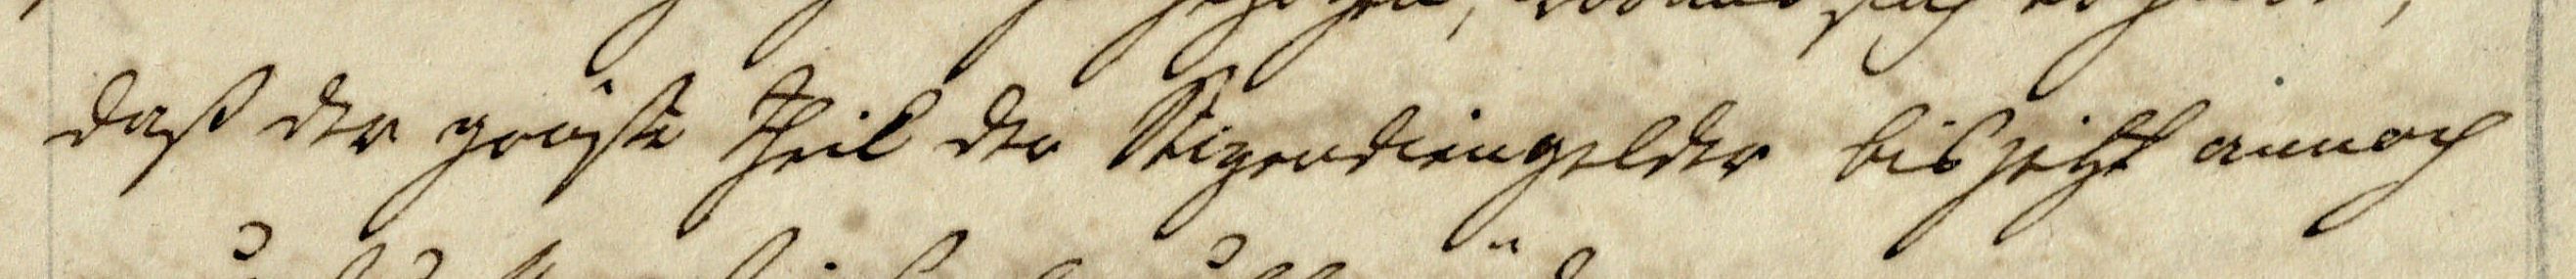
daß der gröste Theil der Stipendiengelder bisjetzt annoch
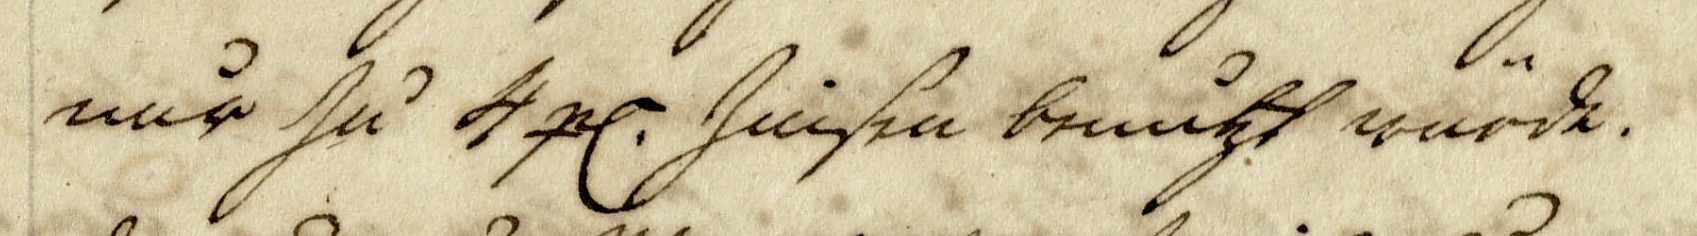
nur zu 4 pl. Zinsen benutzt würde.
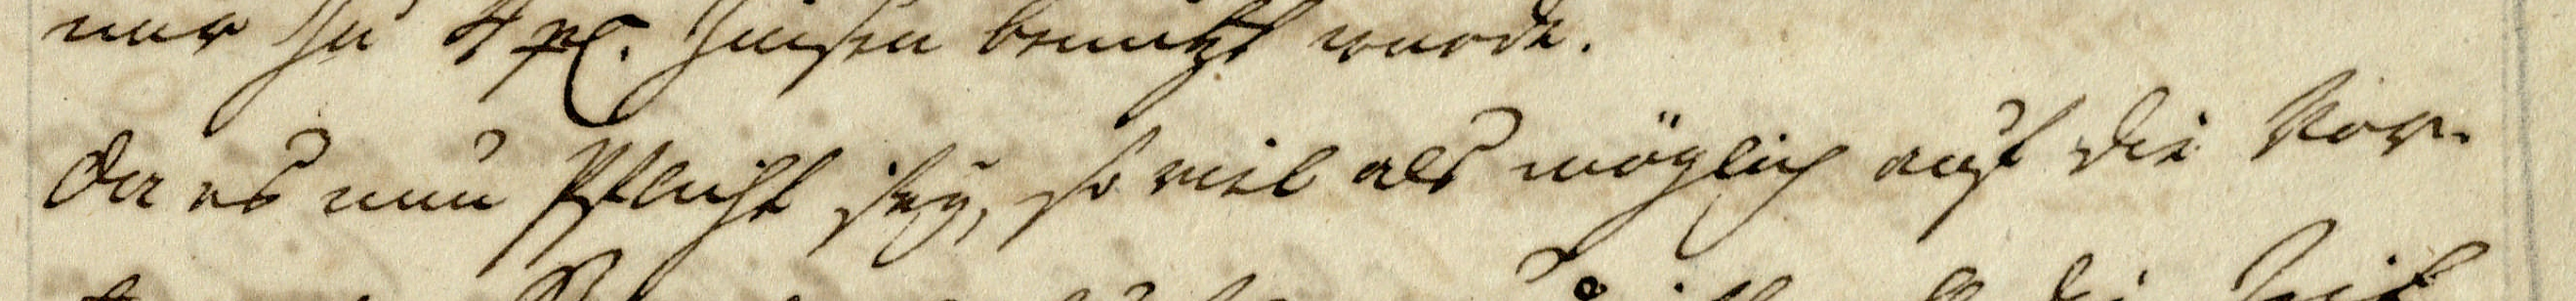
Da es nun Pflicht seÿ, so viel als möglich auf die Vor¬
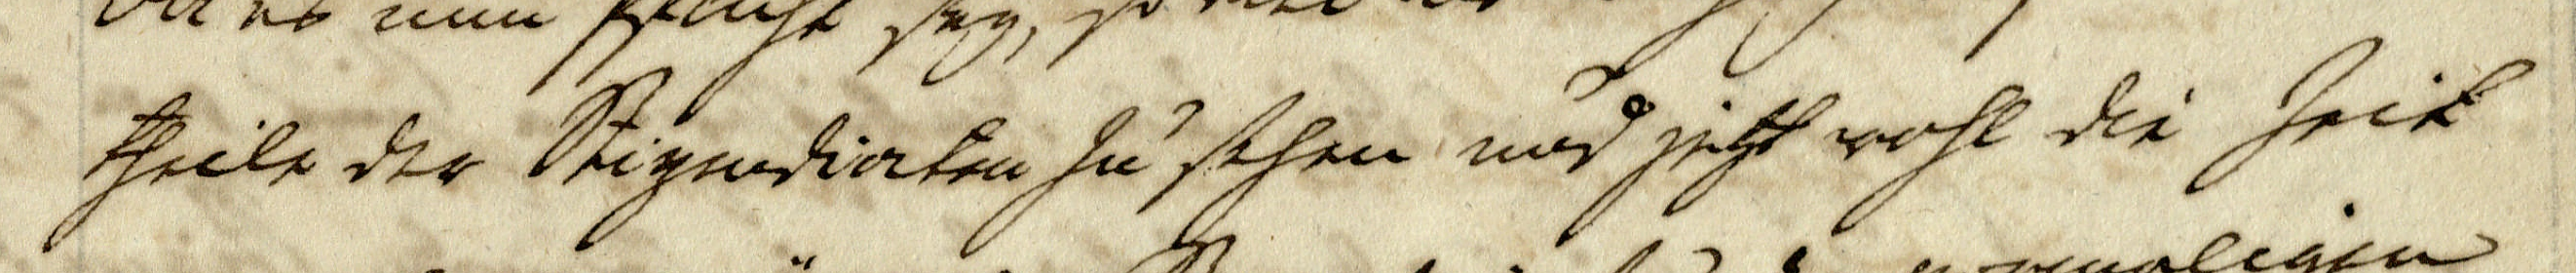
theile der Stipendiaten zu sehen und jetzt wohl die Zeit
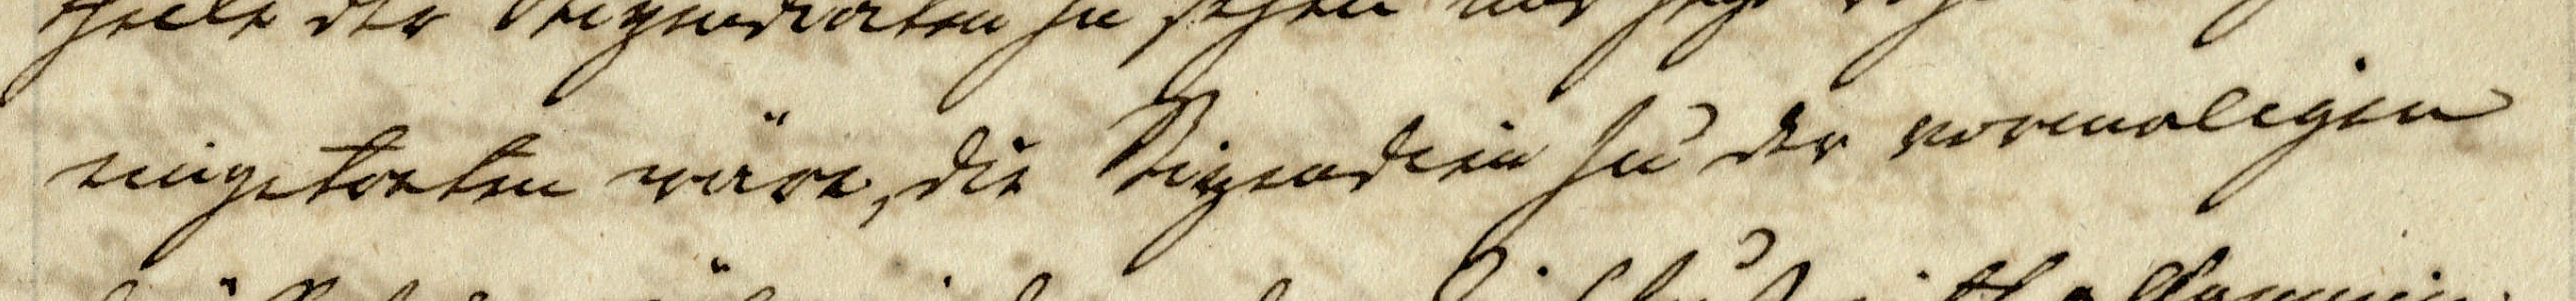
eingetreten wäre, die Stipendien zu der vormaligen
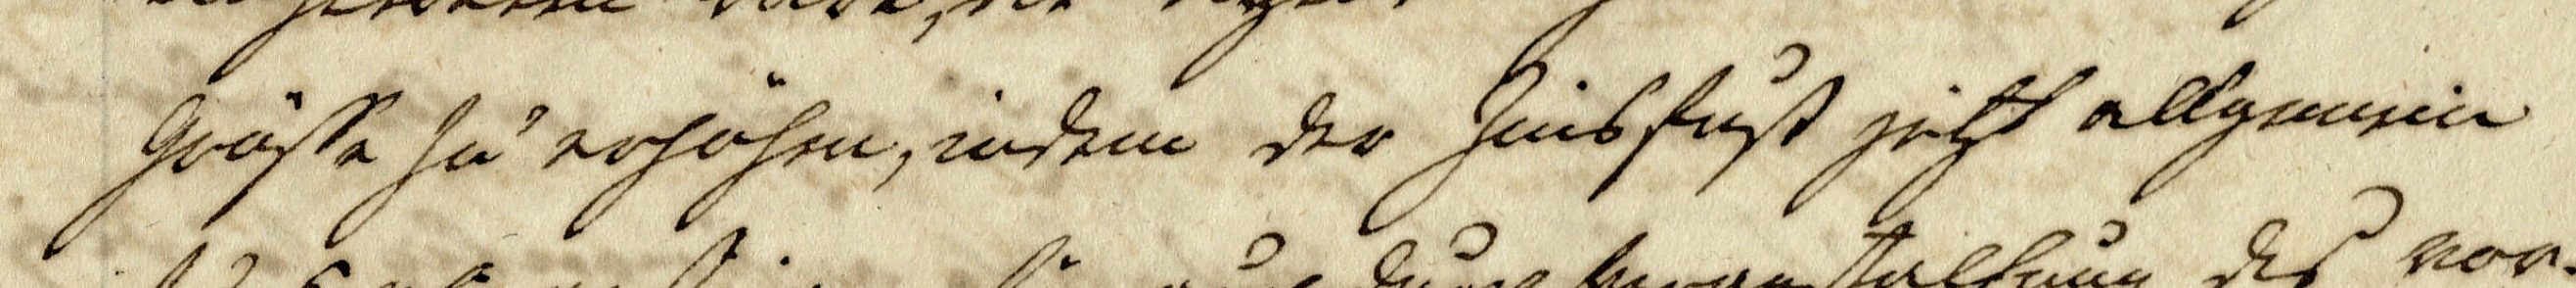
Grösse zu erhöhen, indem der Zinsfuß jetzt allgemein
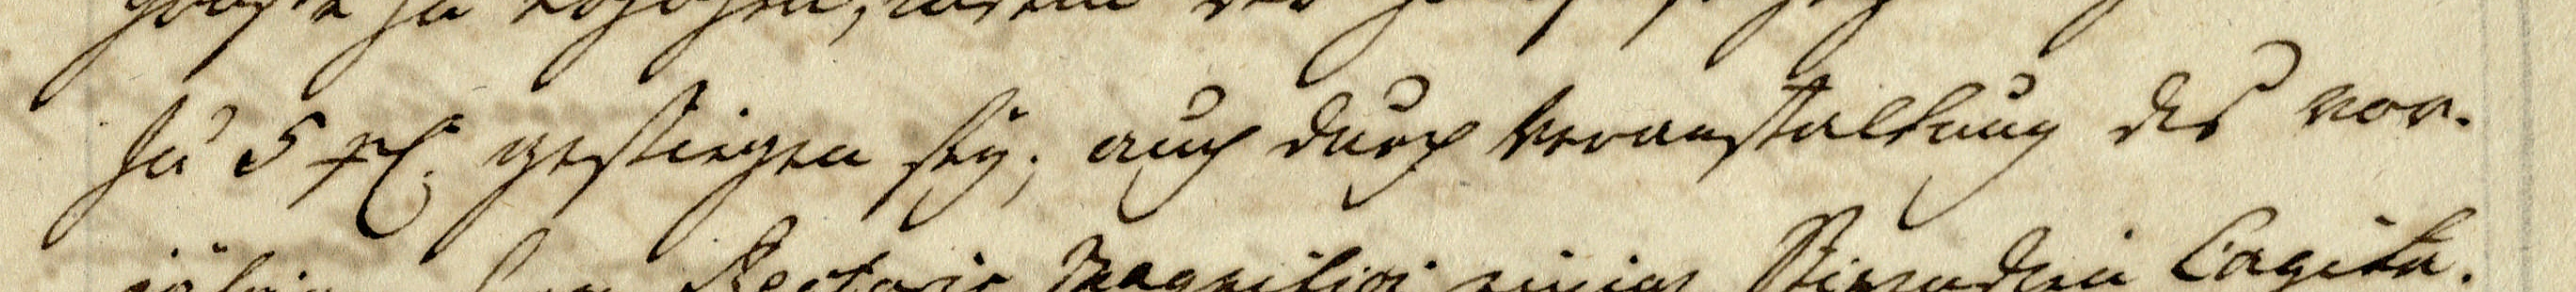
zu 5 pl. gestiegen seÿ; auch durch Veranstaltung des vor¬
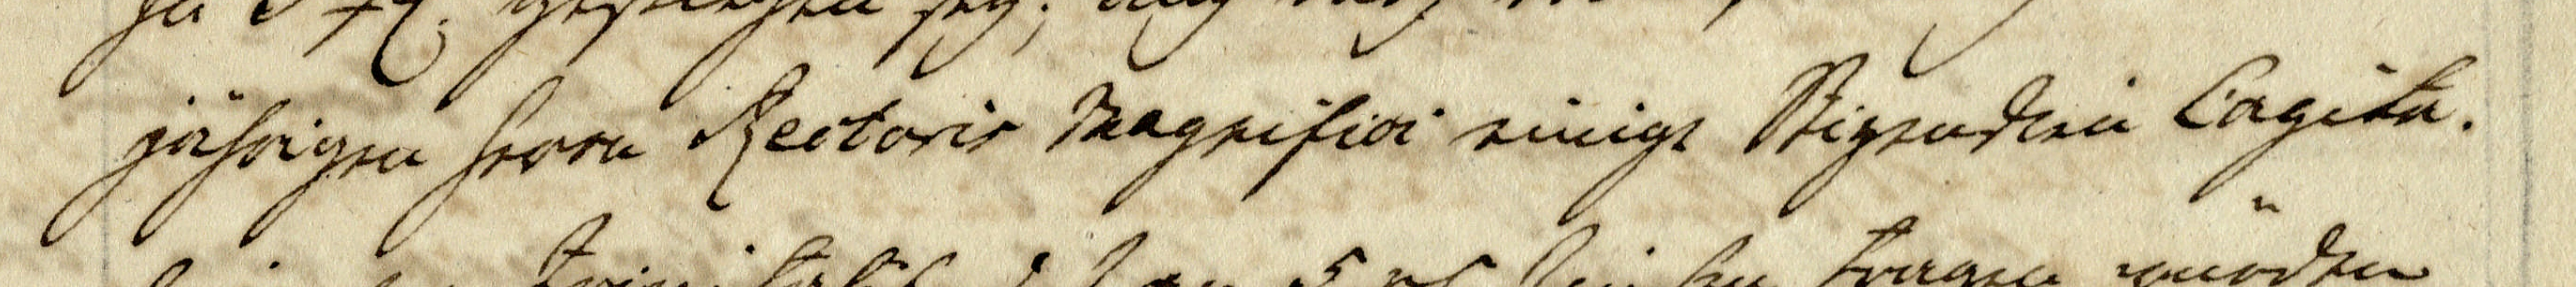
jährigen Herrn Rectoris Magnifici einige Stipendien Capita¬
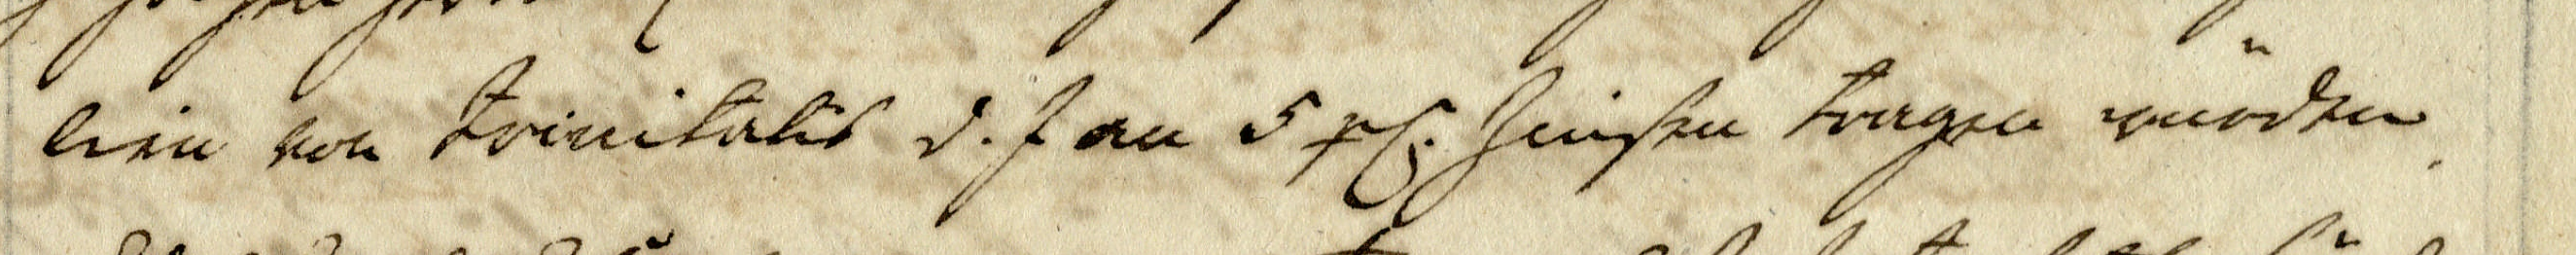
lien von Trinitatis d. J. an 5 pl Zinsen tragen würden
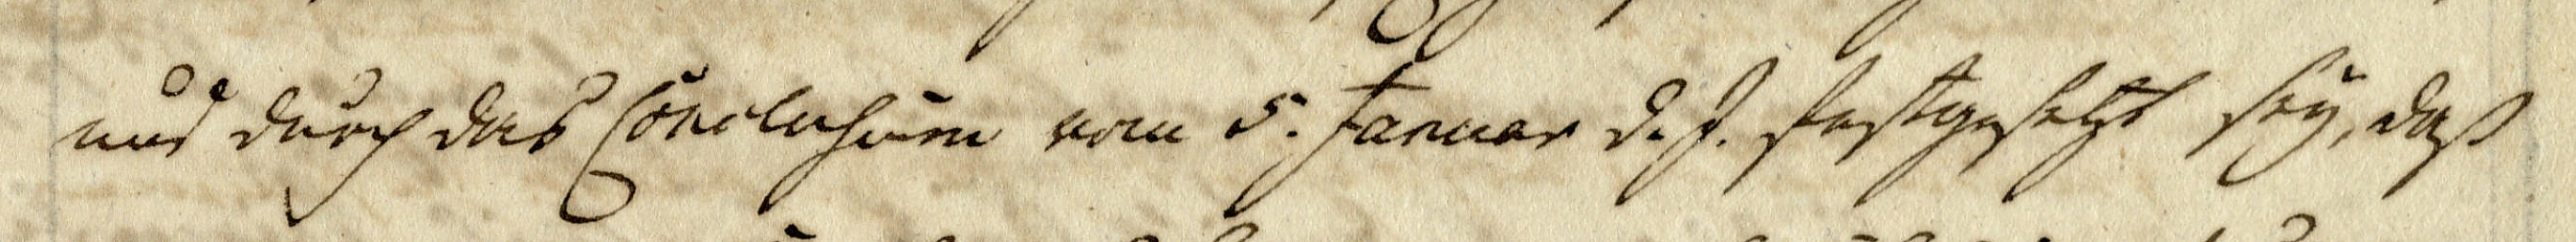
und durch das Conclusum vom 5. Januar d. J. festgesetzt seÿ, daß
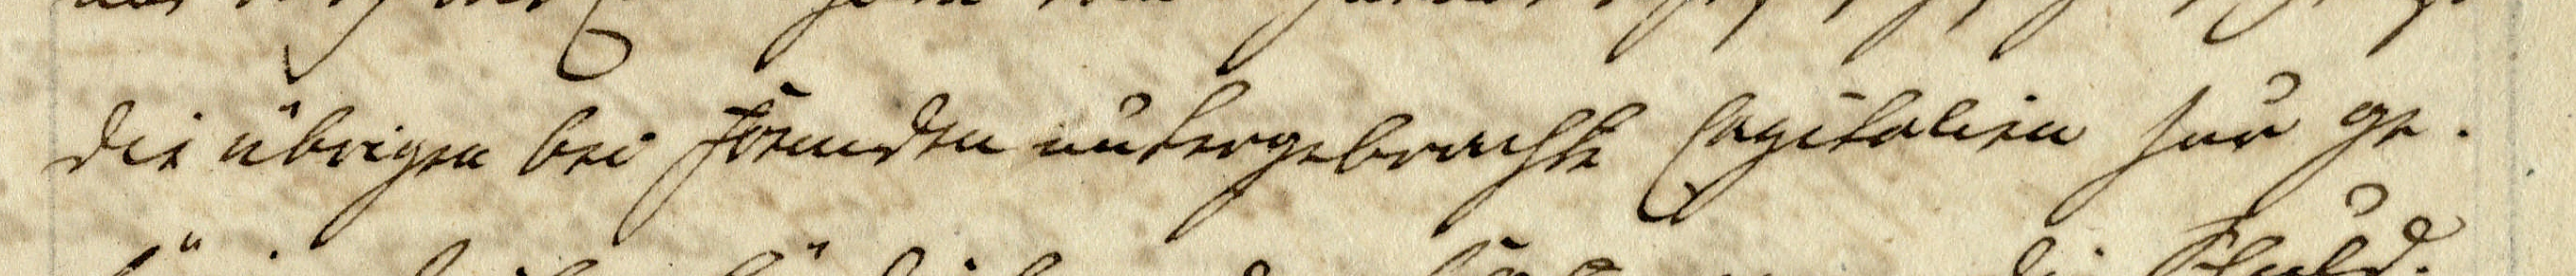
die übrigen bei Fremden untergebrachte Capitalien zur ge¬
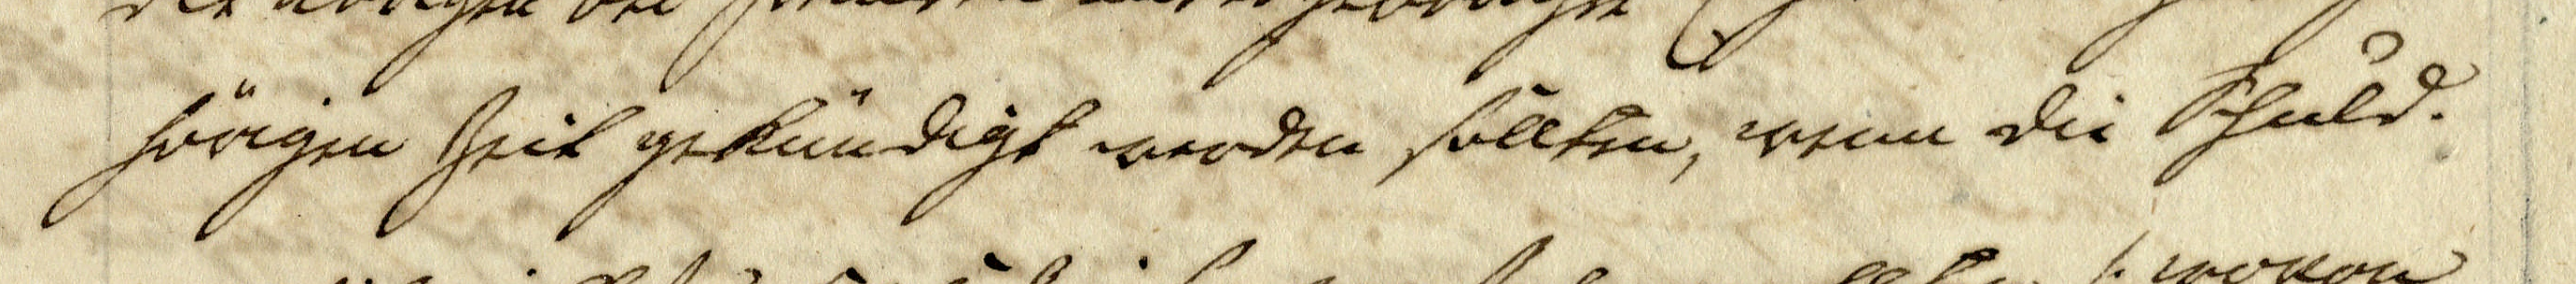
hörigen Zeit gekündigt werden sollten, wenn die Schuld¬
